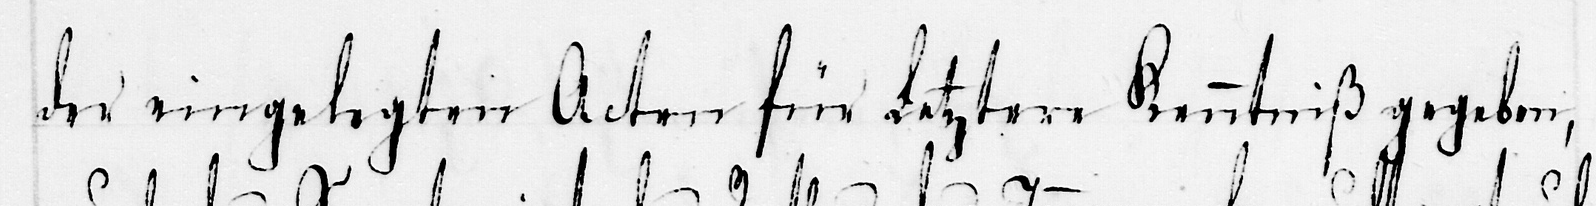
der eingelegten Acten für Letztere Kenntniß gegeben,
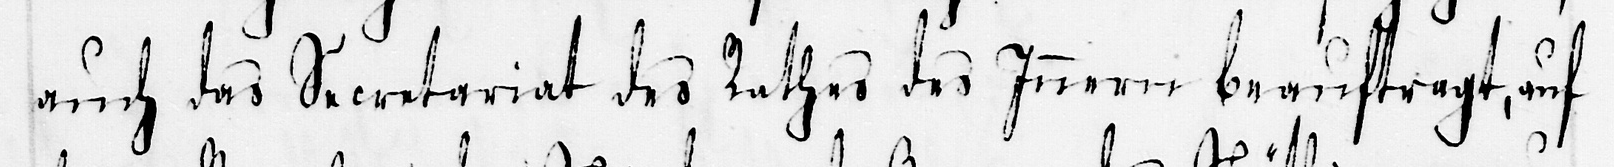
auch das Secretariat des Rathes des Innern beauftragt, auf
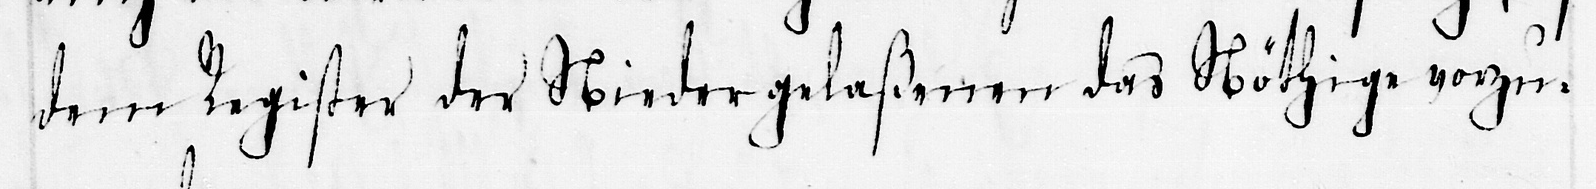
dem Register der Niedergelaßenen das Nöthige vorzu¬
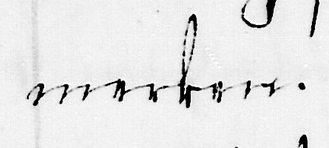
merken.
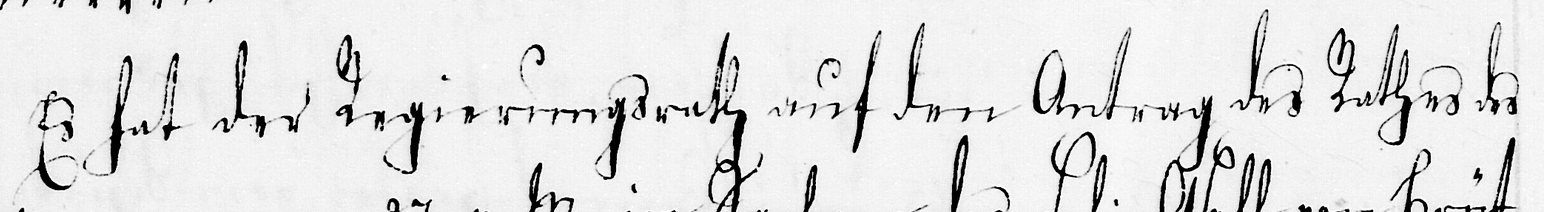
Es hat der Regierungsrath auf den Antrag des Rathes
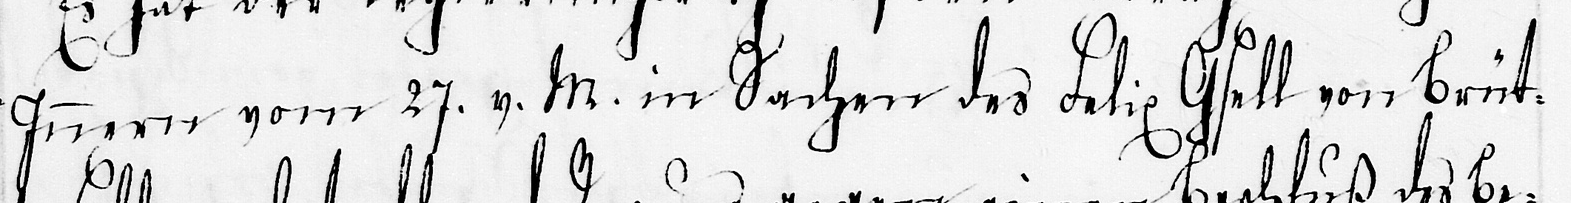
Innern vom 27. v. M. in Sachen des Felix Gsell von Brüt¬
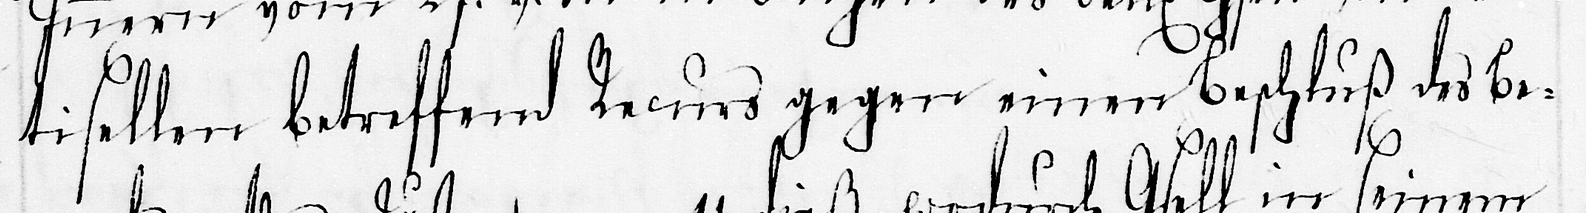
tisellen betreffend Recurs gegen einen Beschluß des Be¬
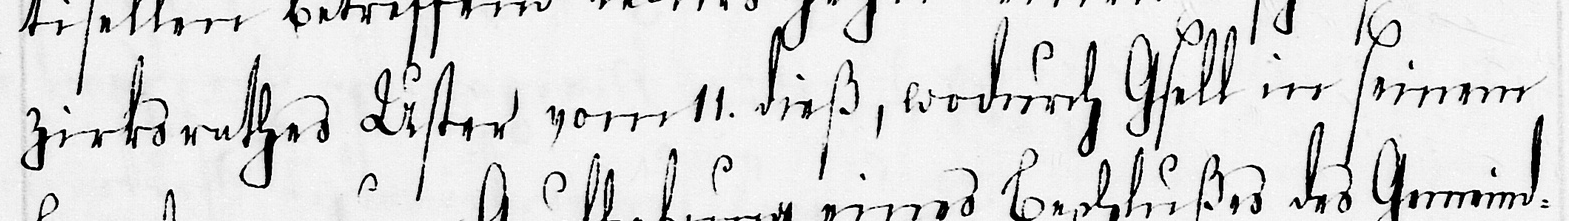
zirksrathes Uster vom 11. dieß, wodurch Gsell in seinem
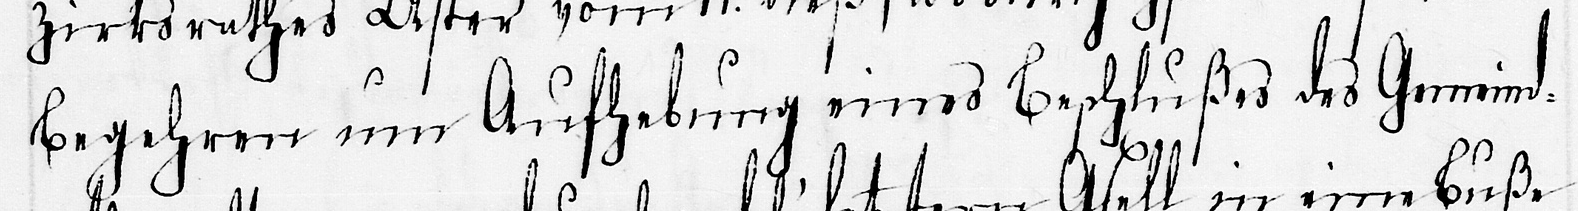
Begehren um Aufhebung eines Beschlußes des Gemeind¬
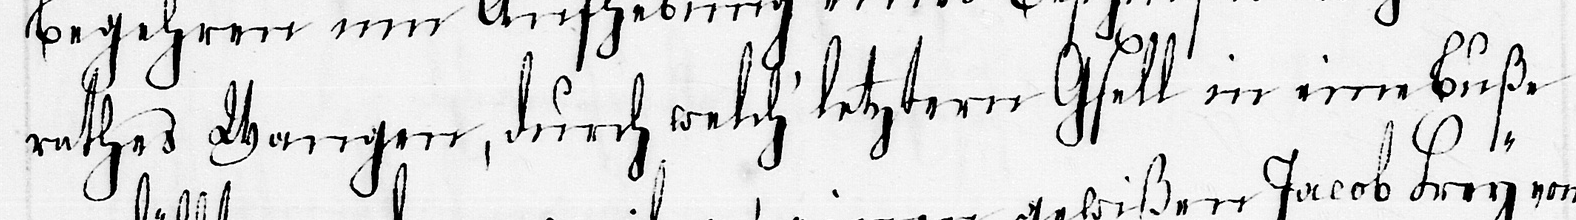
rathes Wangen, durch welch‘ letztern Gsell in eine Buße
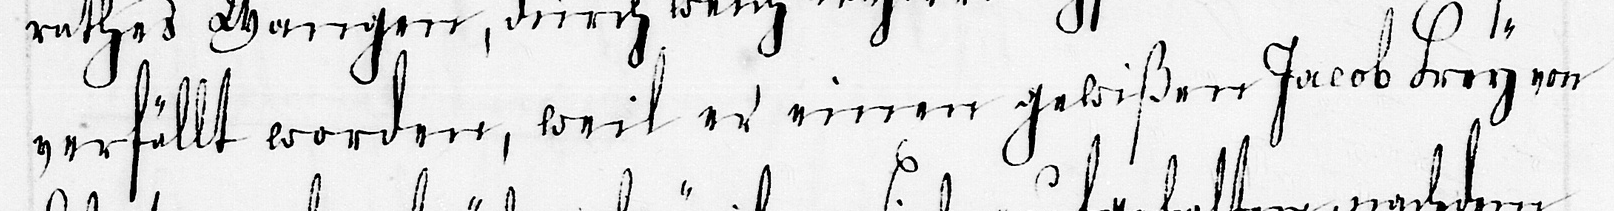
verfällt worden, weil er einen gewißen Jacob Frey von
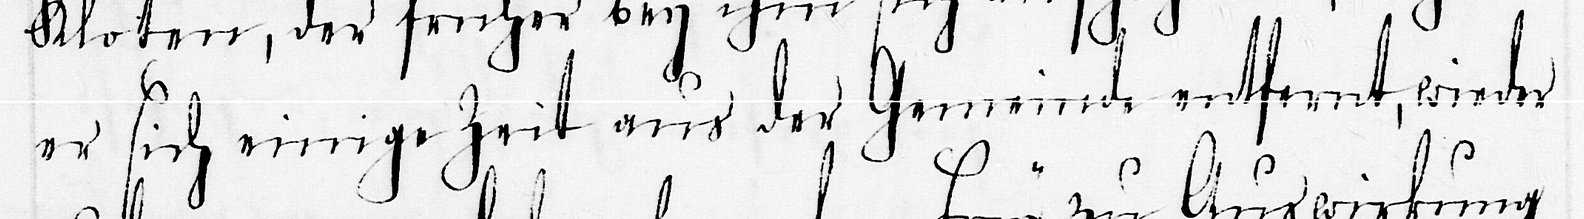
er sich einige Zeit aus der Gemeinde entfernt, wieder
